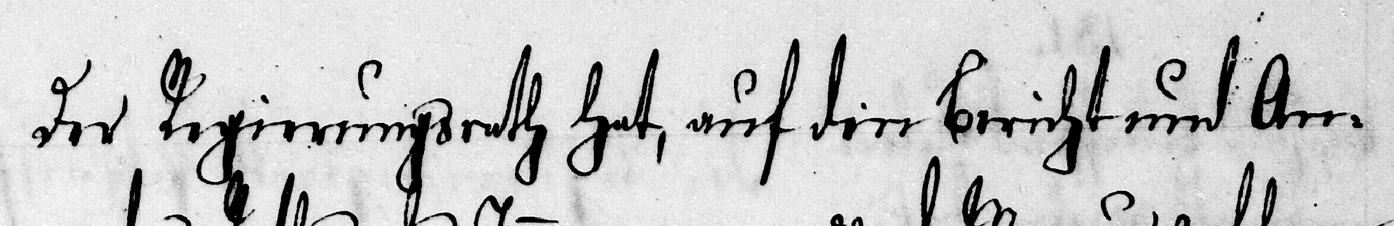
Der Regierungsrath hat, auf den Bericht und An¬
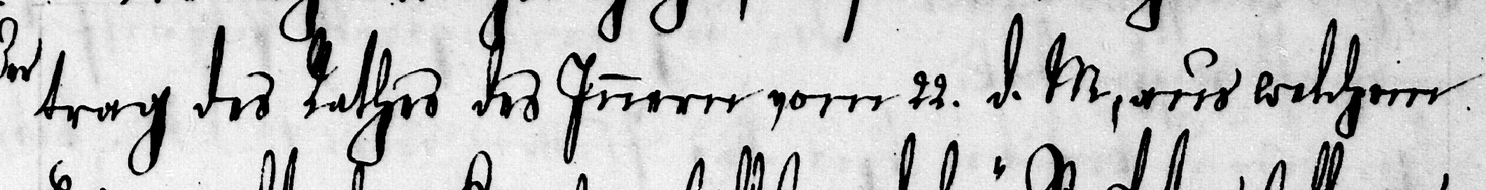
trag des Rathes des Innern vom 22. d. M., aus welchem
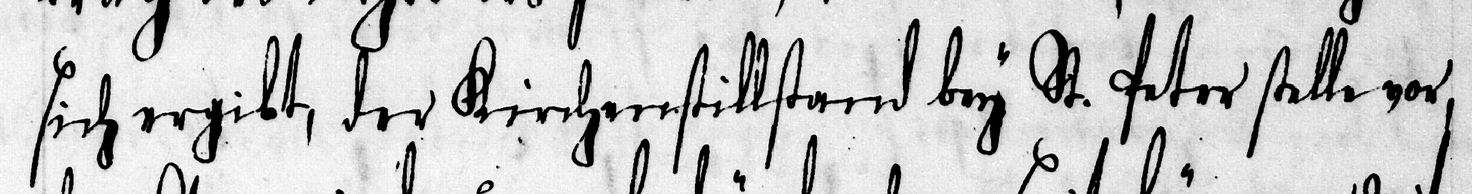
sich ergibt, der Kirchenstillstand bey St. Peter stelle
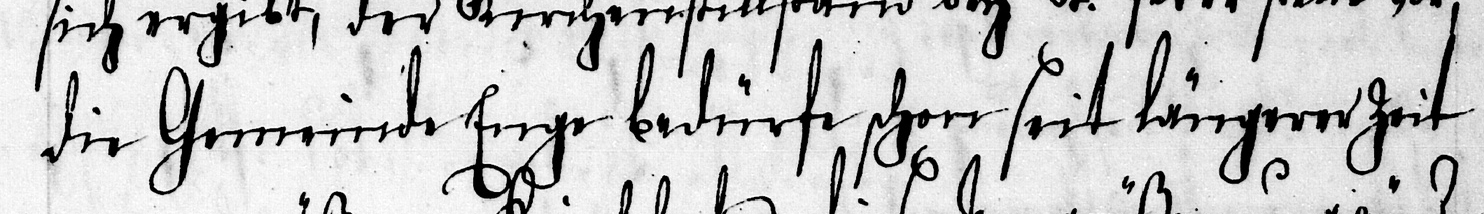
die Gemeinde Enge bedürfe schon seit längerer Zeit
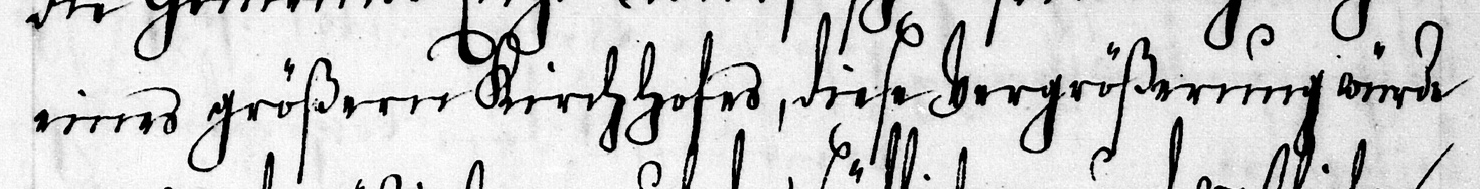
eines größern Kirchhofes, diese Vergrößerung würde
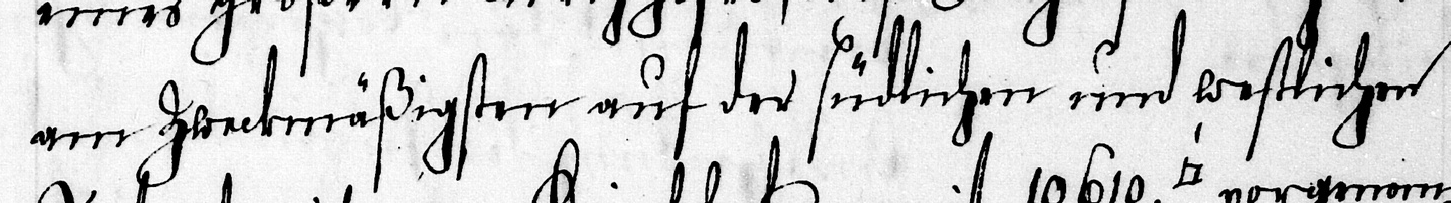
am Zweckmäßigsten auf der südlichen und westlichen
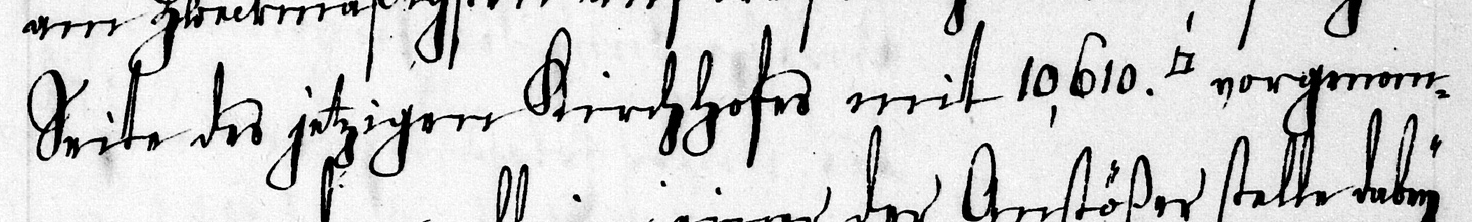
Seite des jetzigen Kirchhofes mit 10,610.□’ vorgenom¬
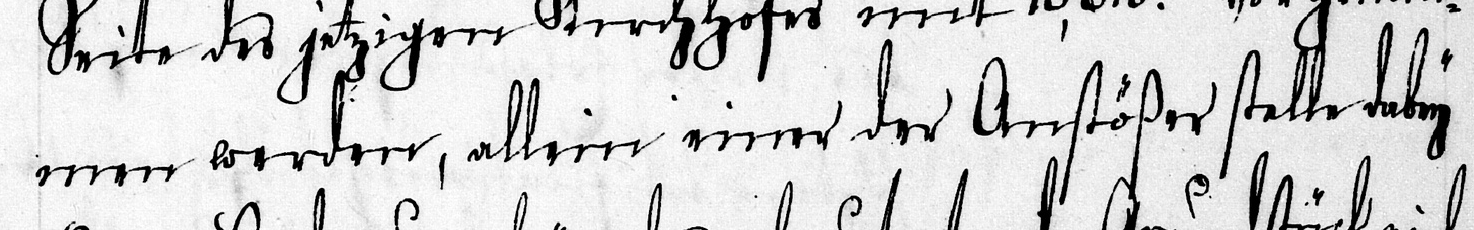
men werden, allein einer der Anstößer stelle dabey
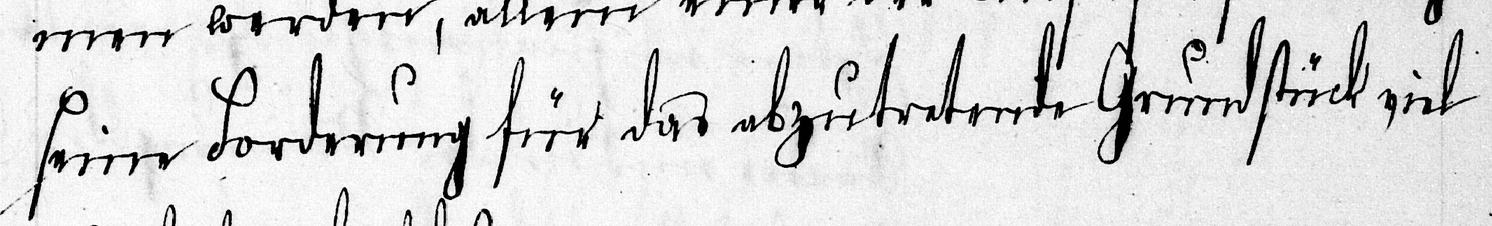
seine Forderung für das abzutretende Grundstück viel
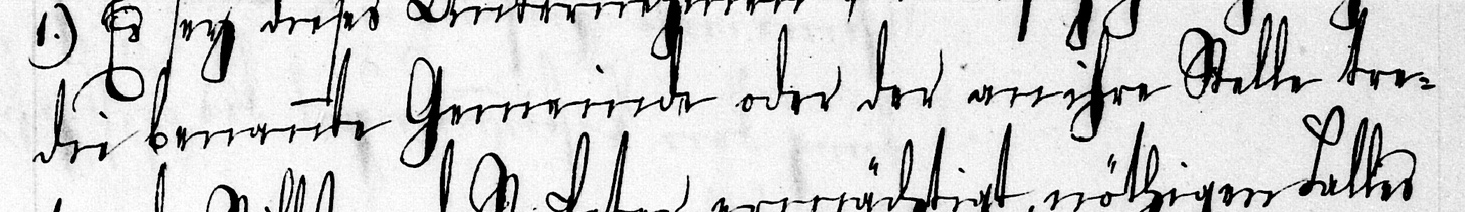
die benannte Gemeinde oder der an ihre Stelle tre¬
